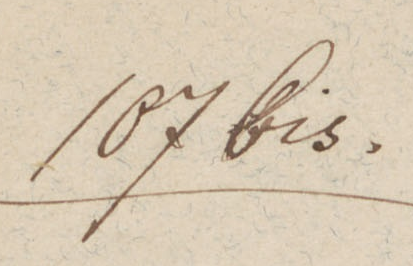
107 bis.
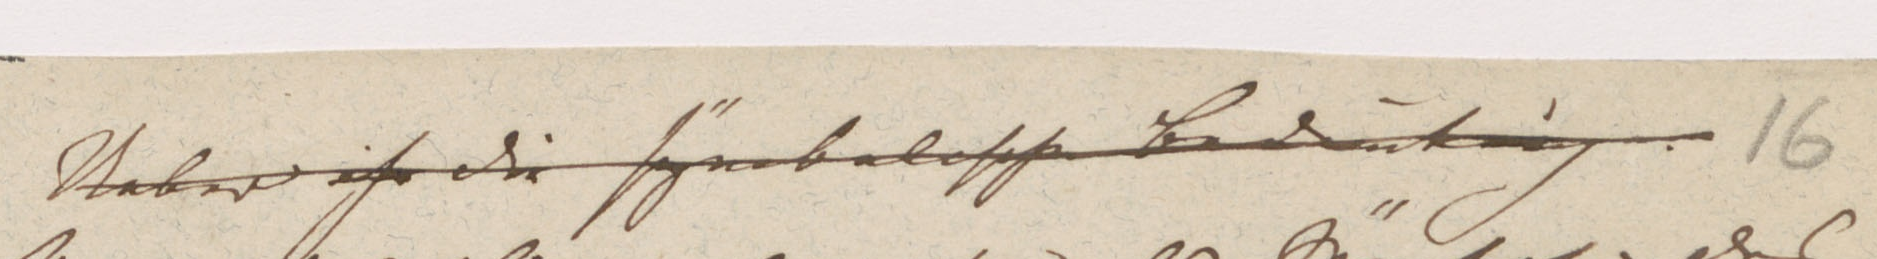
Ueber ih die symbolische Bedeutung
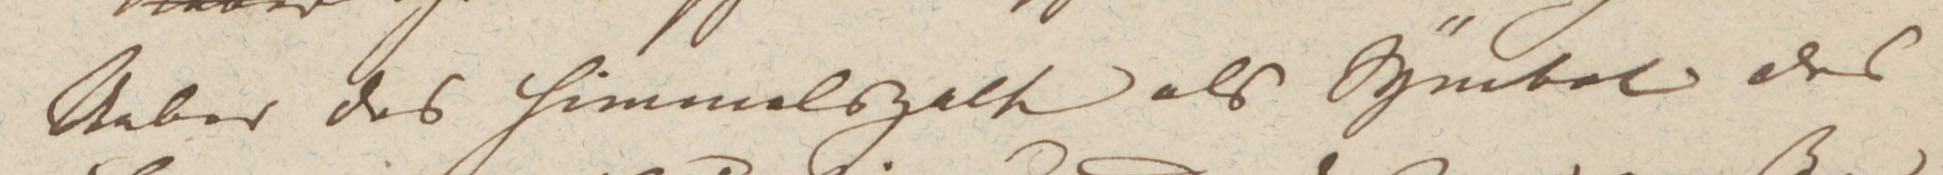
Ueber das Himmelszelt als Symbol des
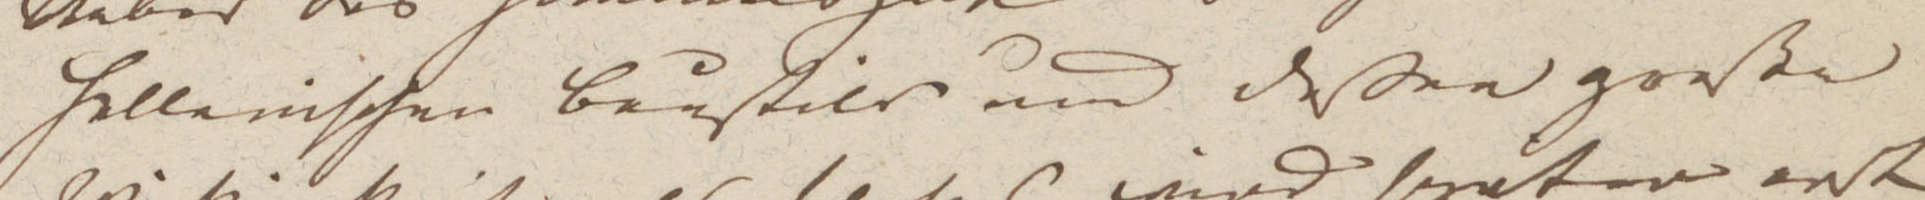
Hellenischen Baustils und dessen grosse
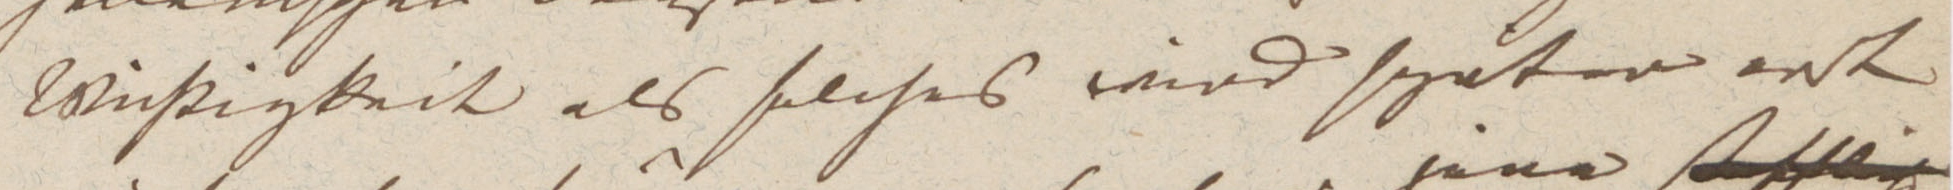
Wichtigkeit als solches wird später erst
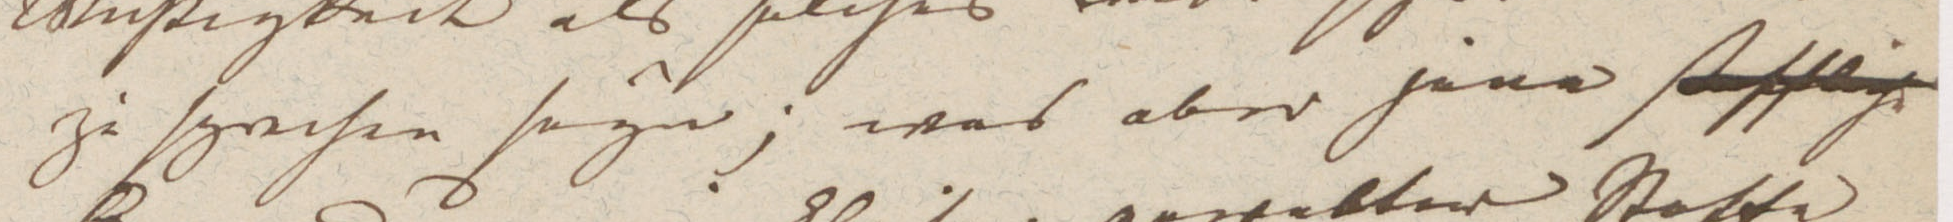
zu sprechen seyn; was aber jene stofflich
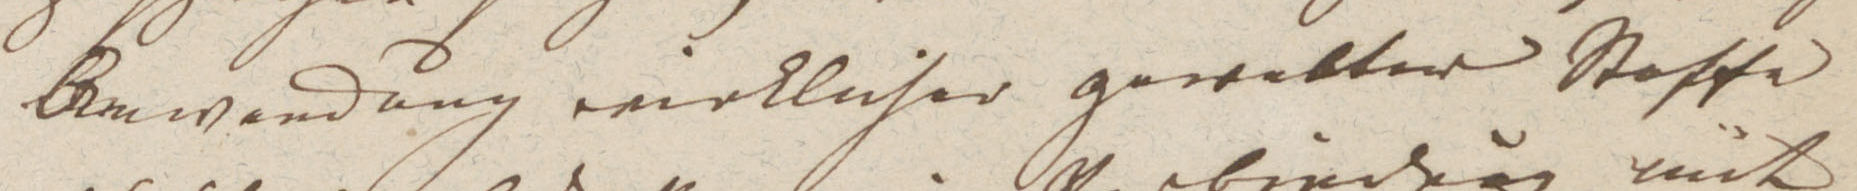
Amwendung wirklicher gewebter Stoffe
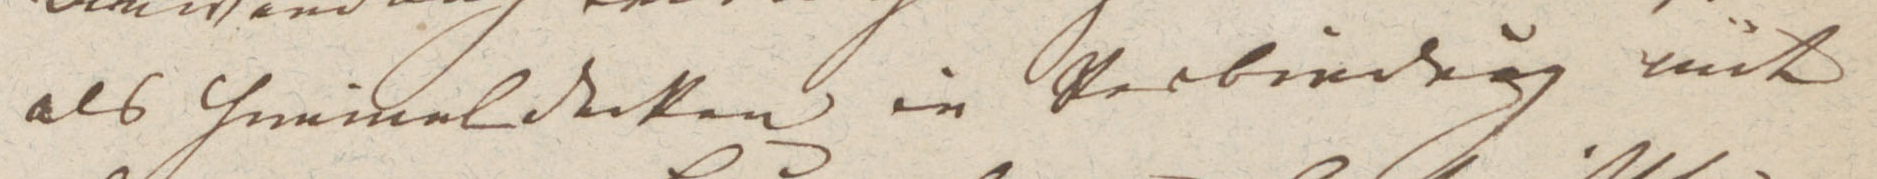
als Himmeldecken in Verbindung mit
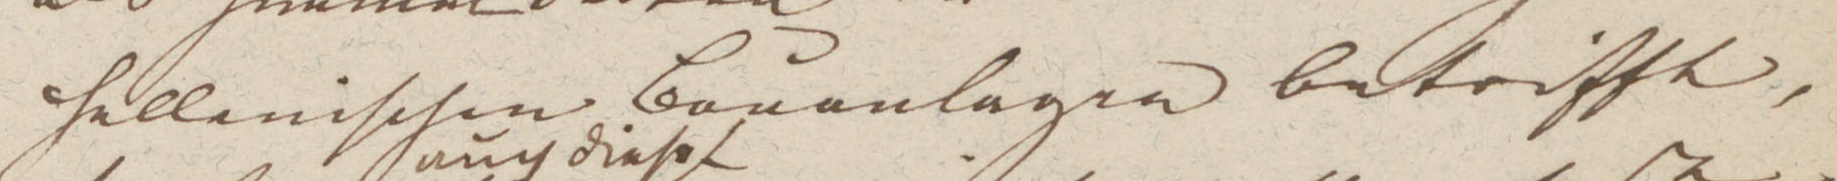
Hellenischen Bauanlagen betrifft,
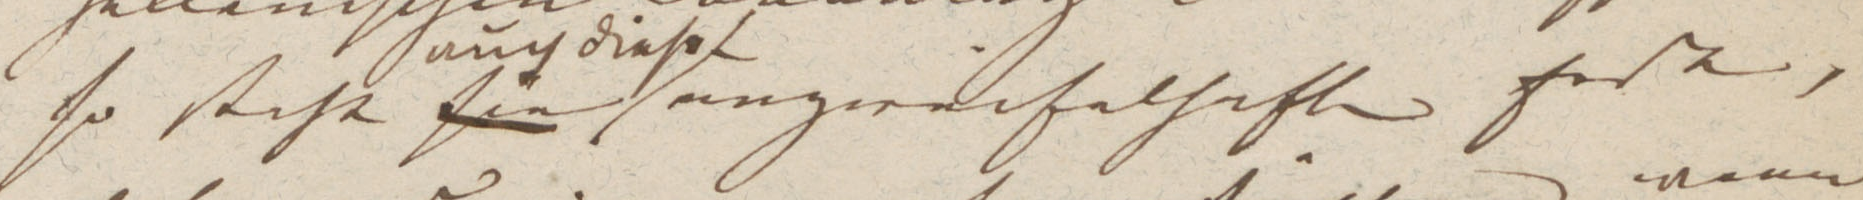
so steht sie auch diese unzweifelhaft fest,
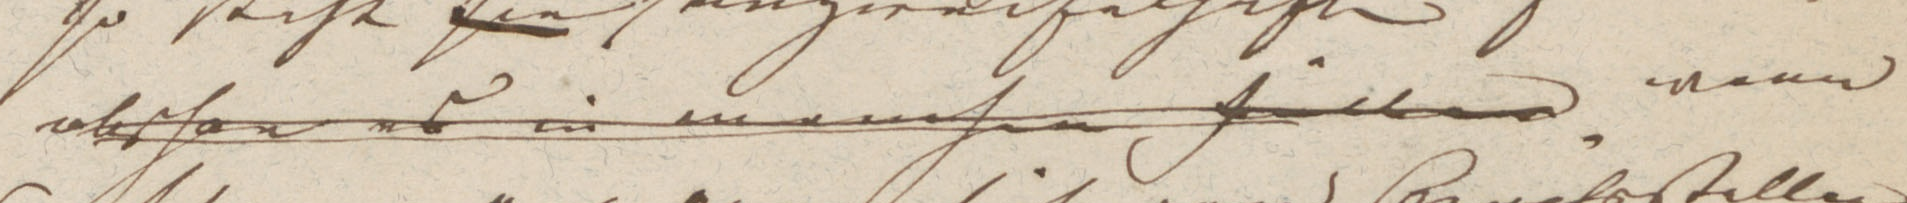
obschon es in manchen Fällen wenn
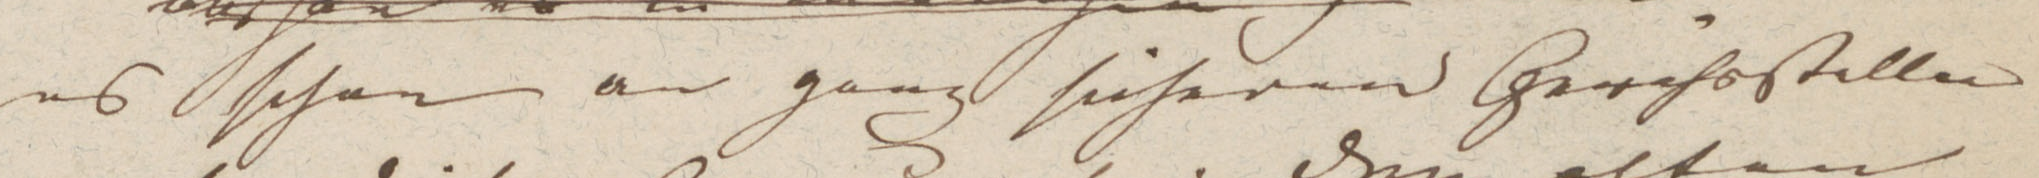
es schon an ganz sicheren Gewährstellen
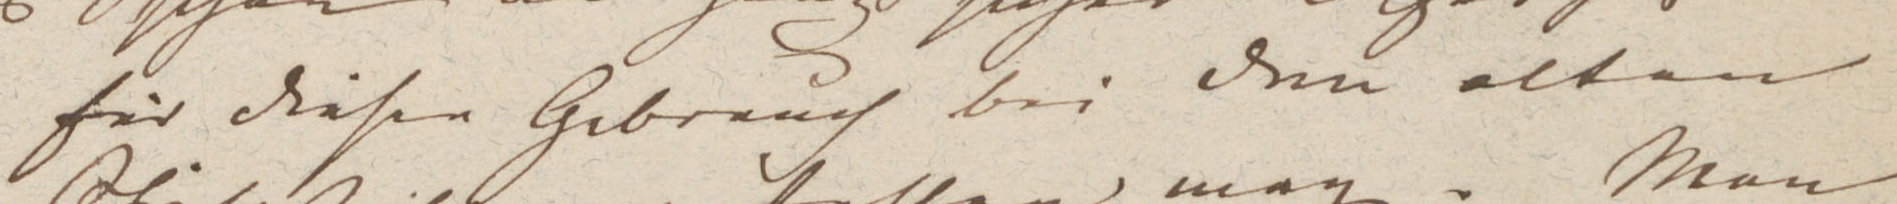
für diesen Gebrauch bei den alten
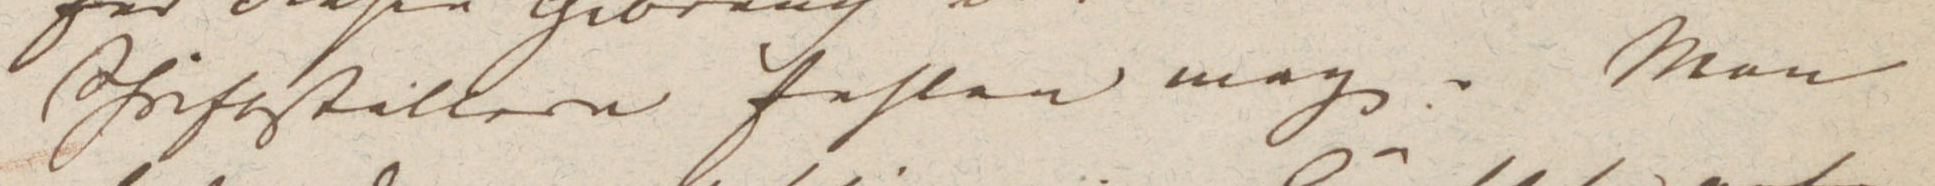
Schriftstellern fehlen mag. Man
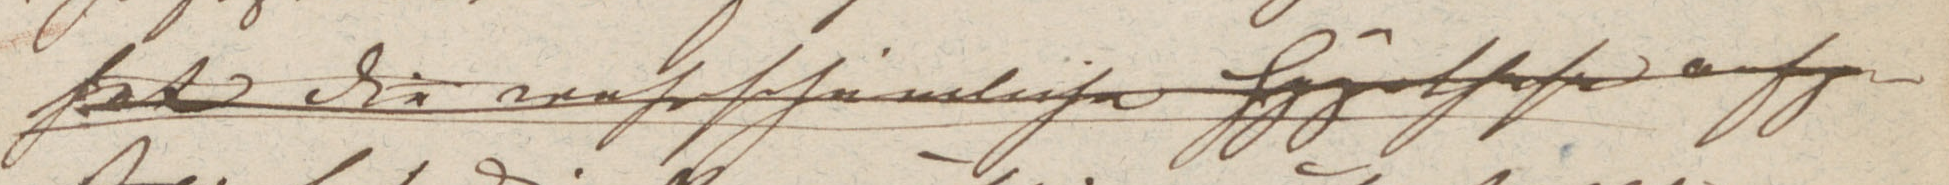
hat die wahrscheinliche Hypothese aufge
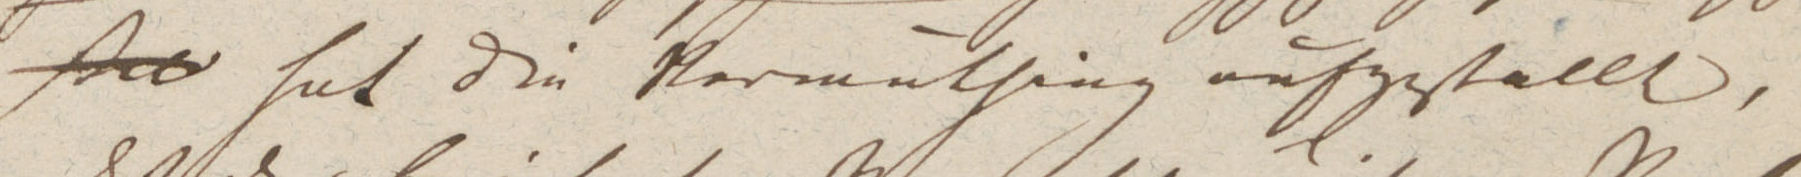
stel hat die Vermuthung aufgestellt,
